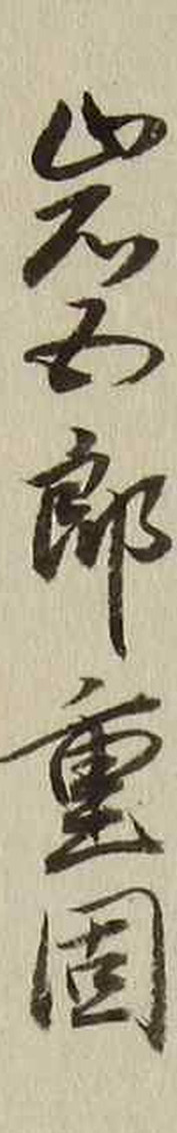岩五郎重固
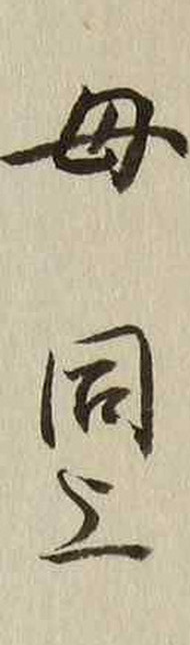母同上
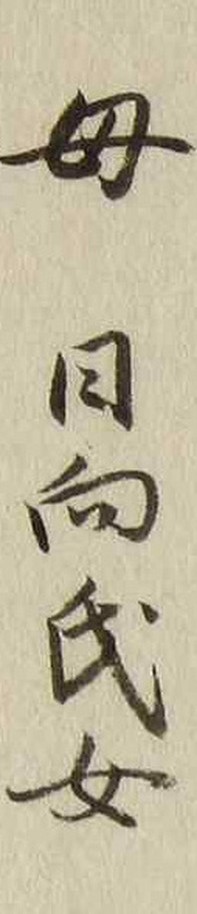母日向氏女
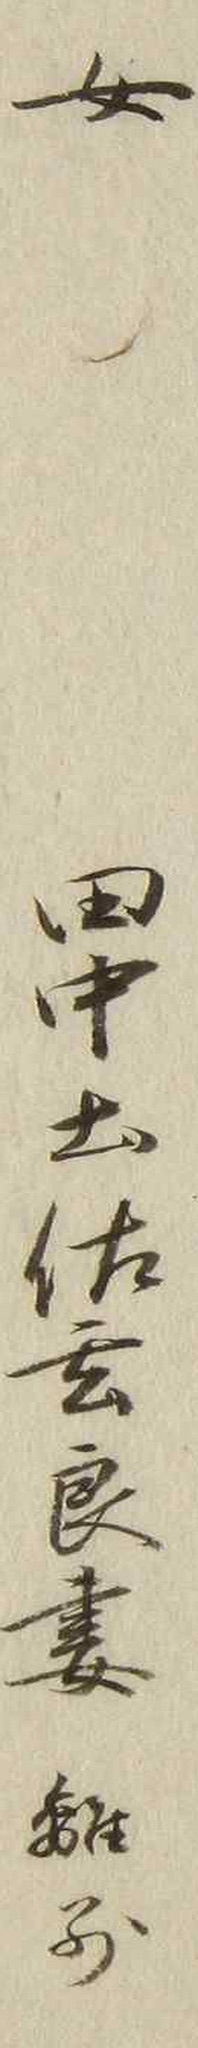女田中土佐玄良妻離別
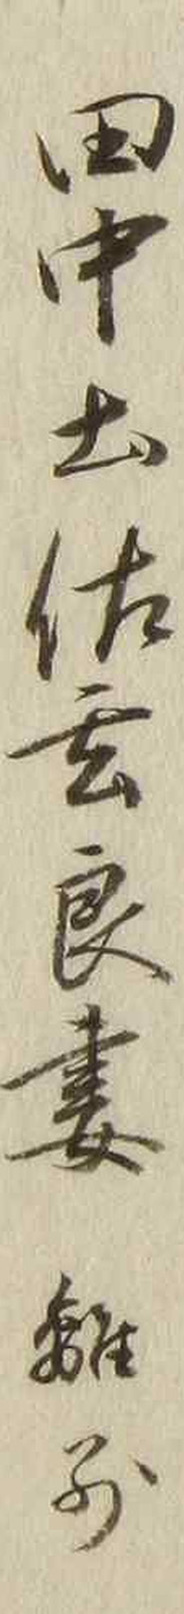女田中土佐玄良妻離別

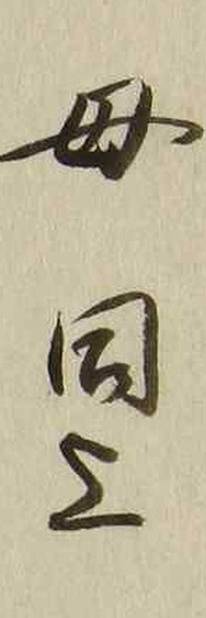母同上
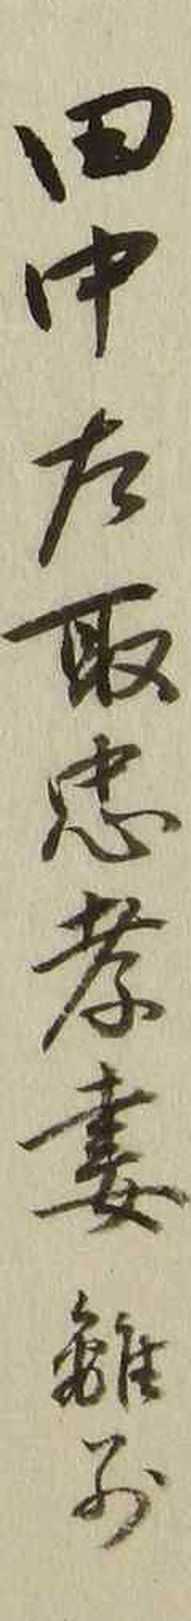女田中左取忠孝妻離別
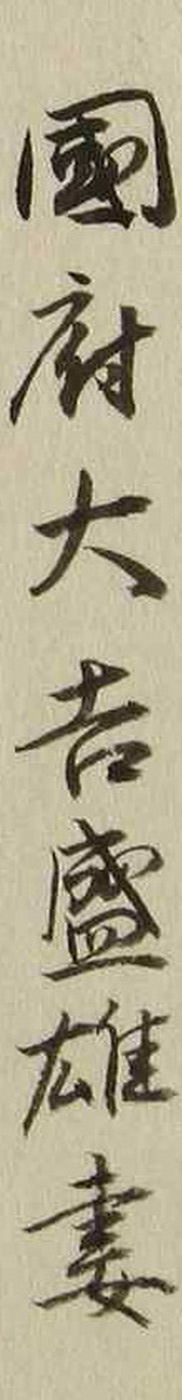国府大吉盛雄妻
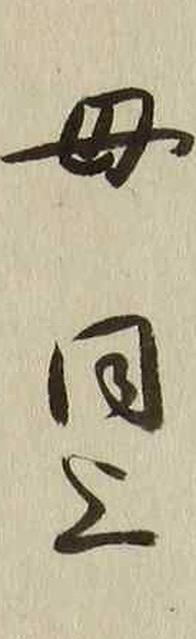母同上
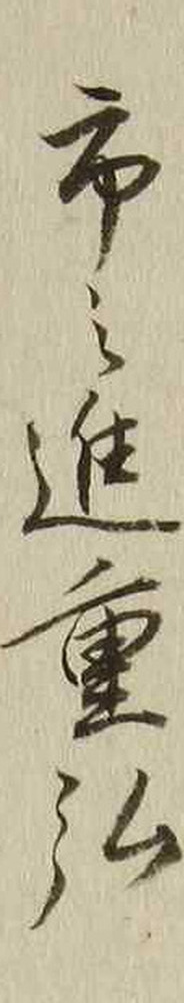市之進重弘
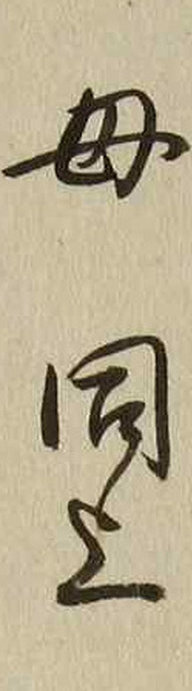母同上
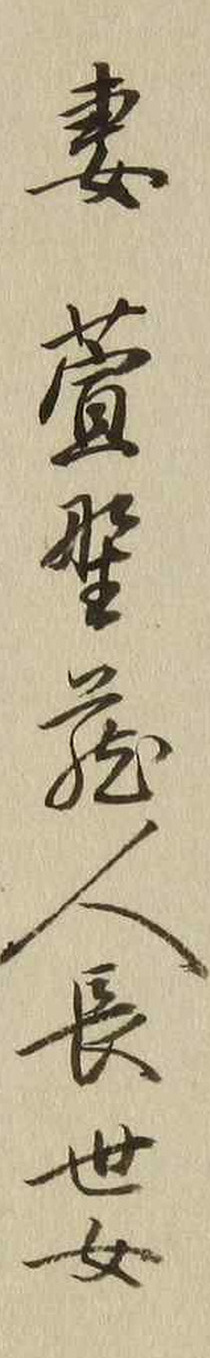妻萱野蔵人長世女
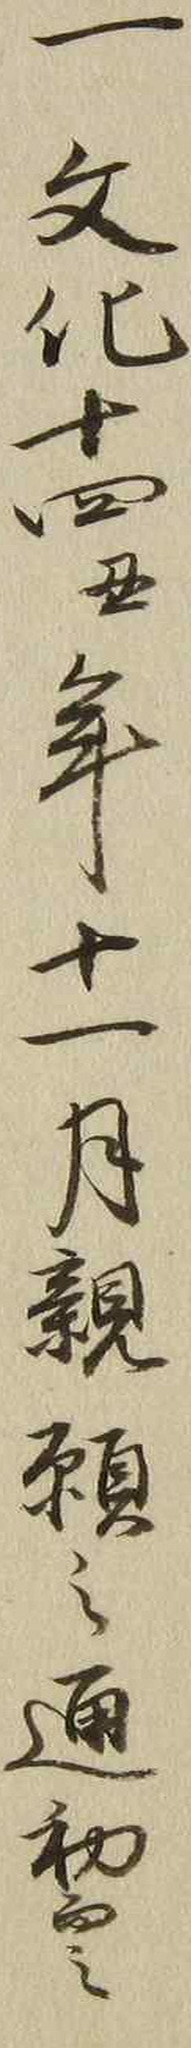一文化十四丑年十一月親願之通初而之
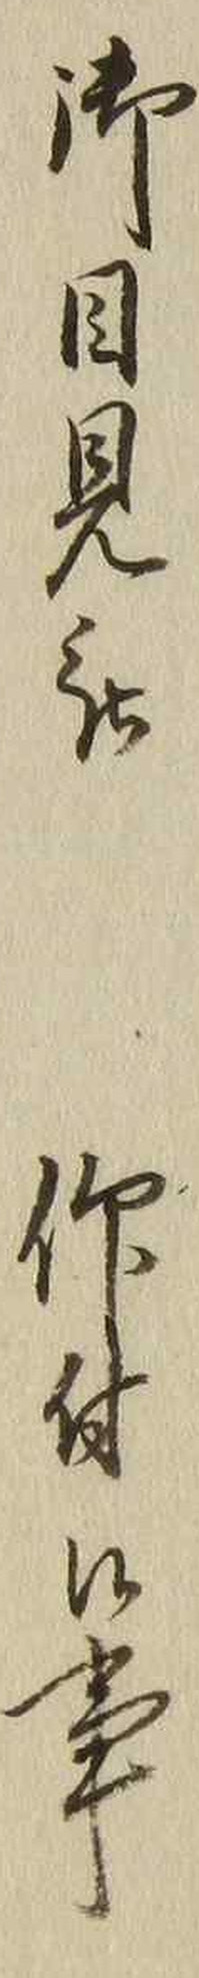御目見被仰付候事
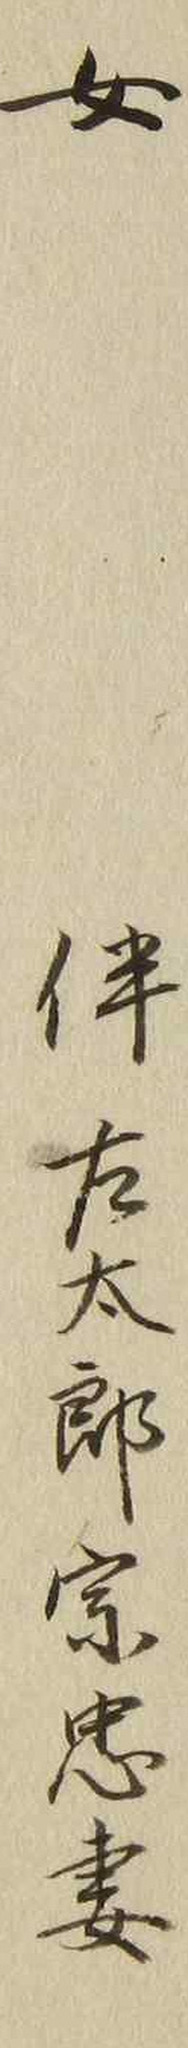女伴左太郎宗忠妻
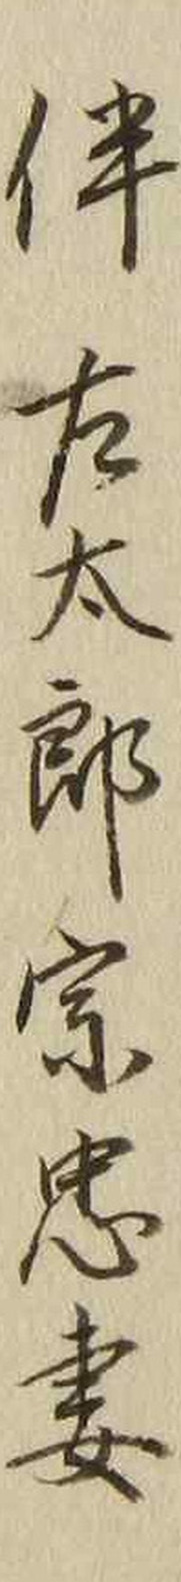女伴左太郎宗忠妻
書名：諸士系譜　巻之133　た之部9
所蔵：会津若松市立会津図書館
